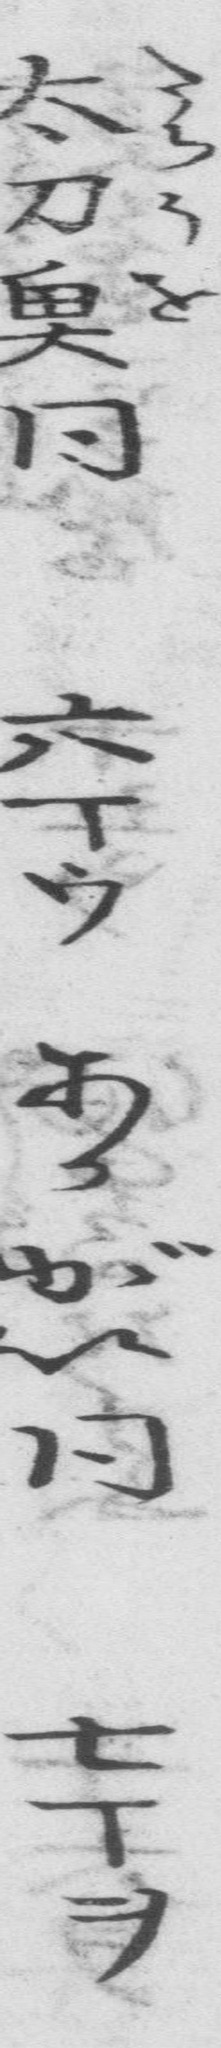太刀魚同六丁ウあかがい同七丁ヲ
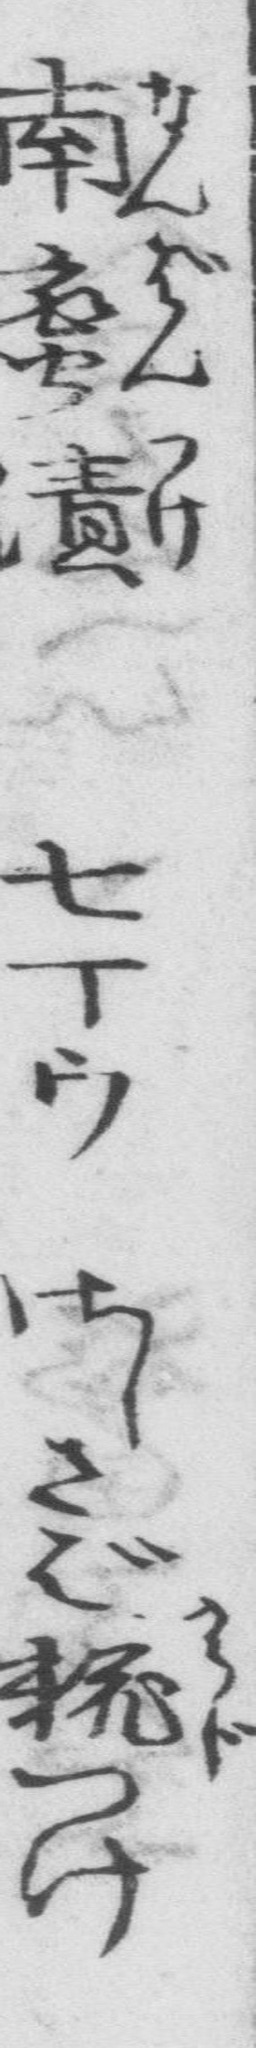南蛮漬七丁ウさしさば糀つけ同
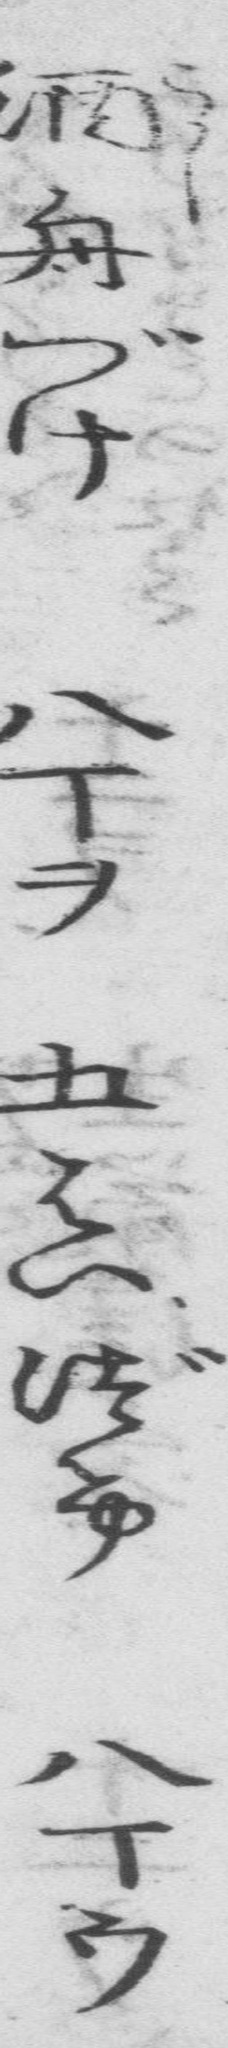酒舟づけ八丁ウ五はいづけ八丁ウ
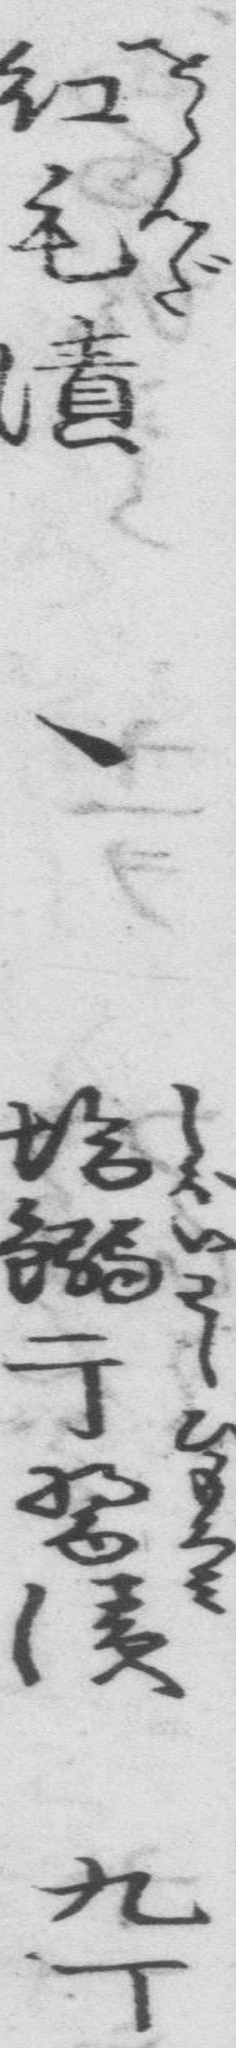紅毛漬同塩鰯干醤漬九丁ヲ

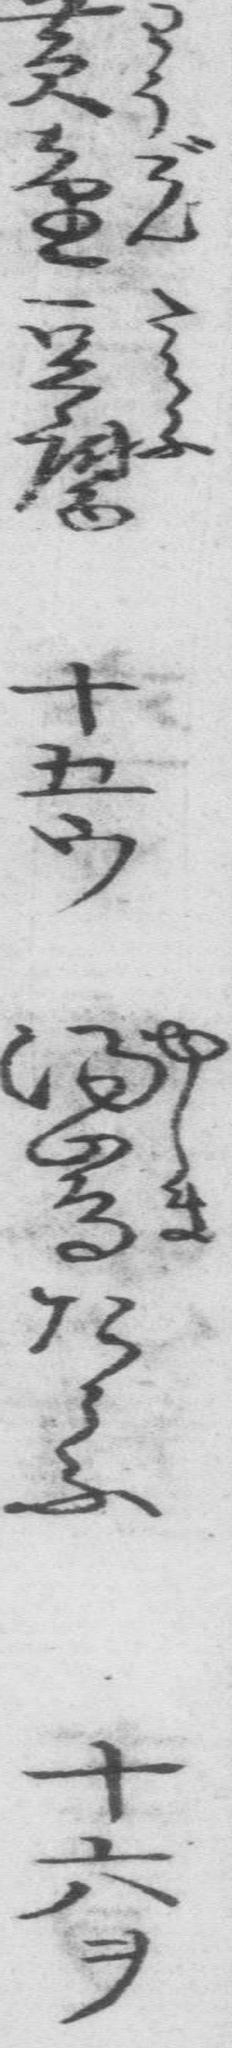黄金豆腐十五ウ湯島たうふ十六ヲ
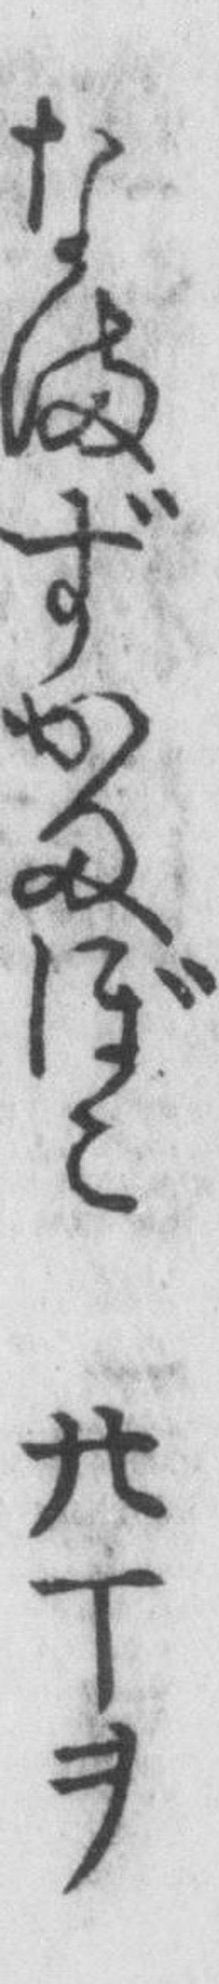なまずかまぼこ廿丁ヲ
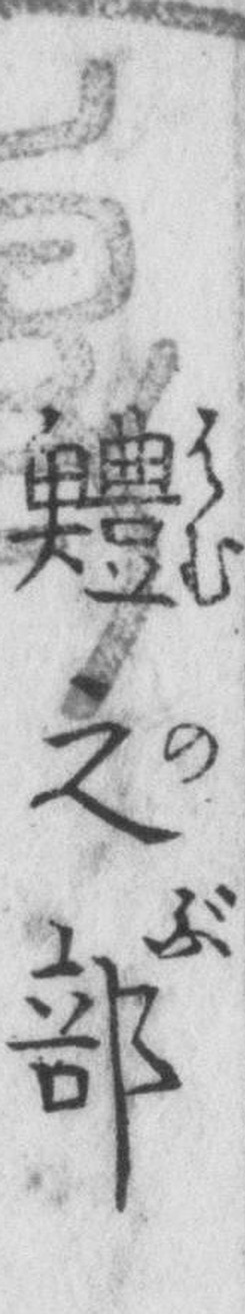鱧之部
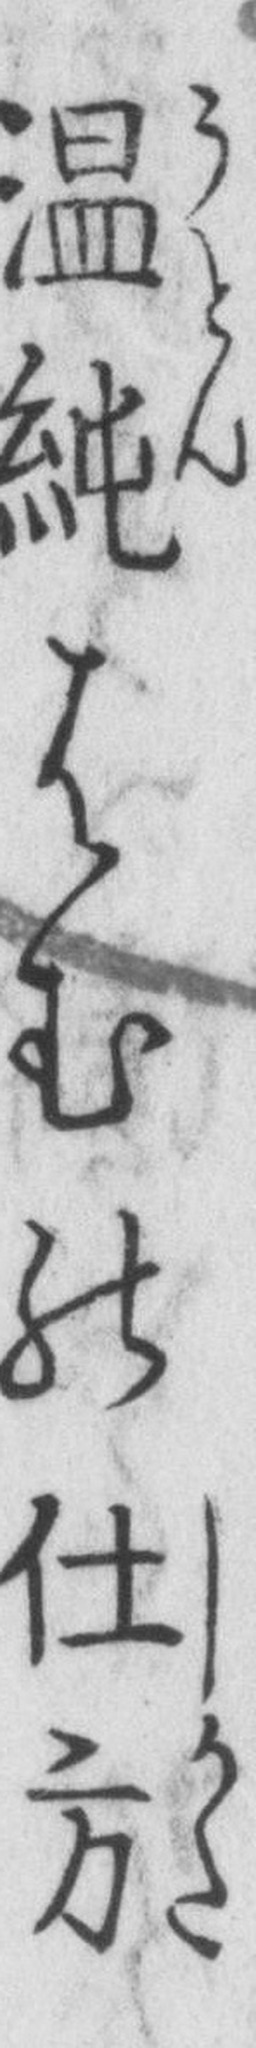饂飩はむの仕方
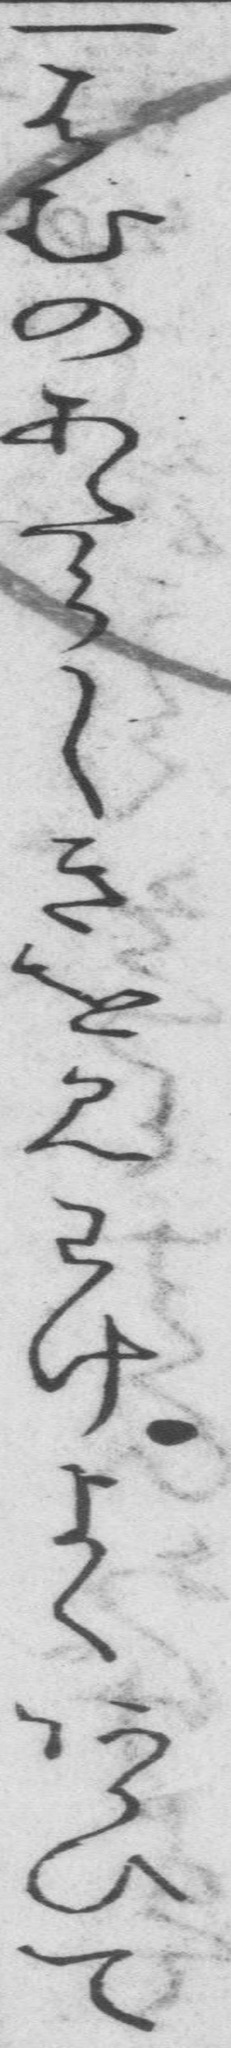一はむのあたらしきを見わけ。よくあらひて
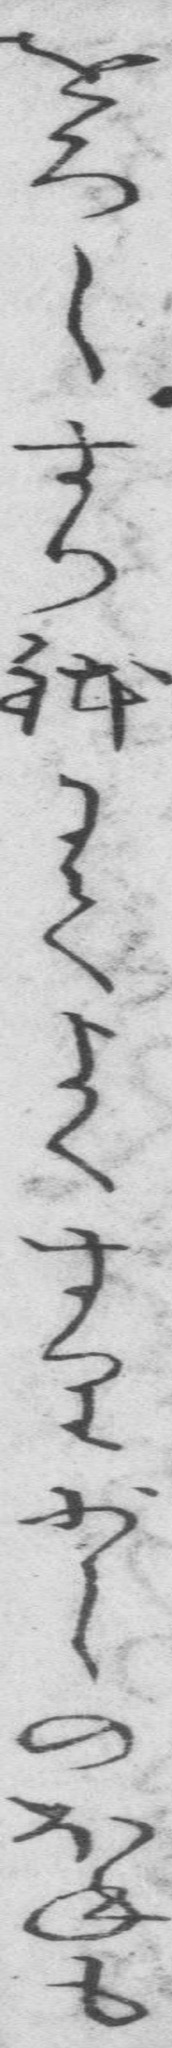をろし。すり鉢にてよくすり。少しのほねも
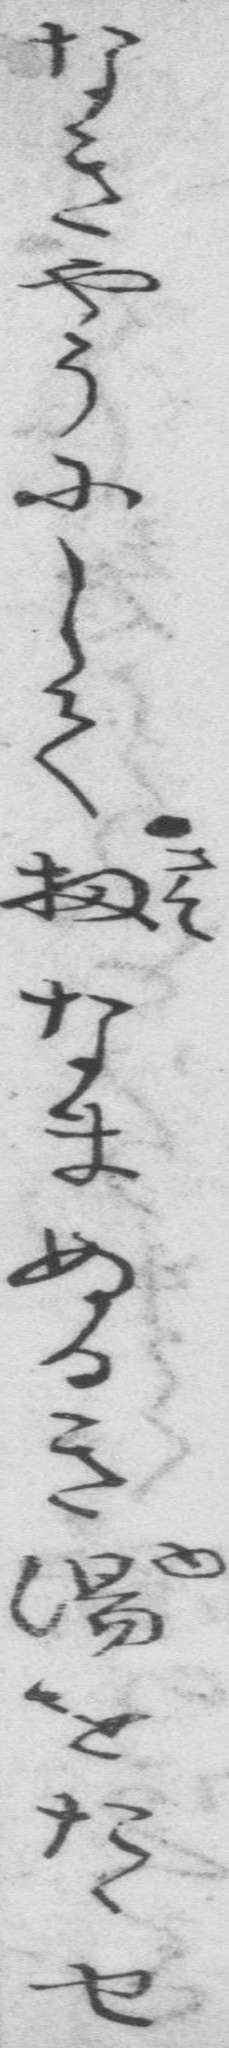なきやうにして。扨なまぬるき湯をたゝせ
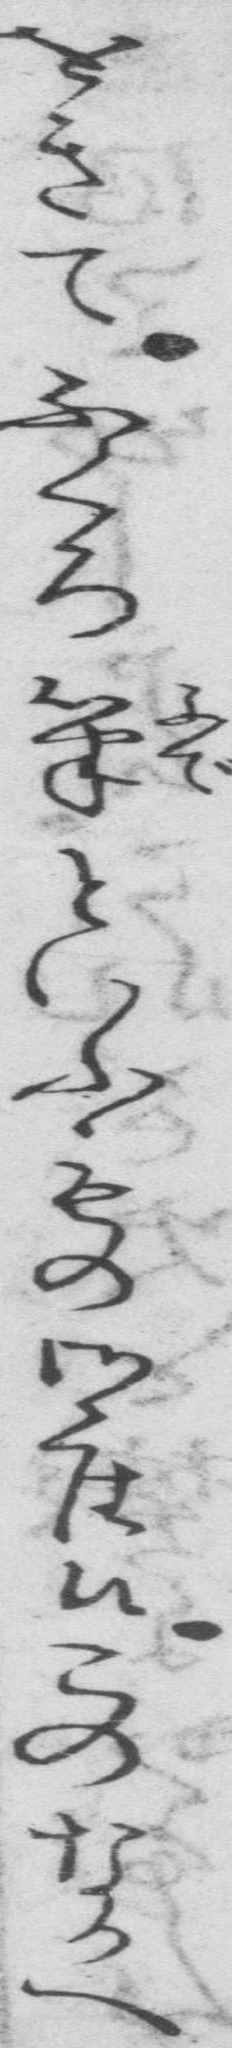をきて。ふくろ筆といふもの御座候。このなかへ
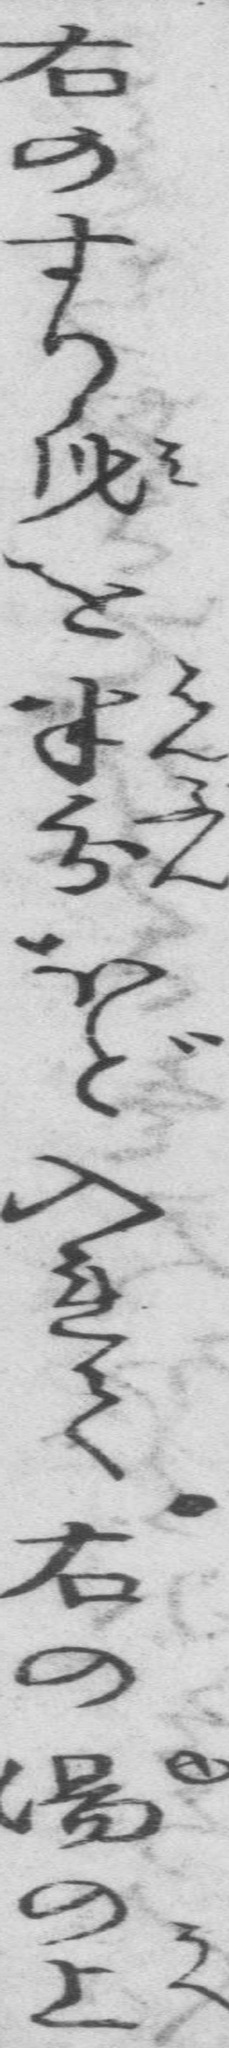右のすり身を半分ほど入れて。右の湯の上

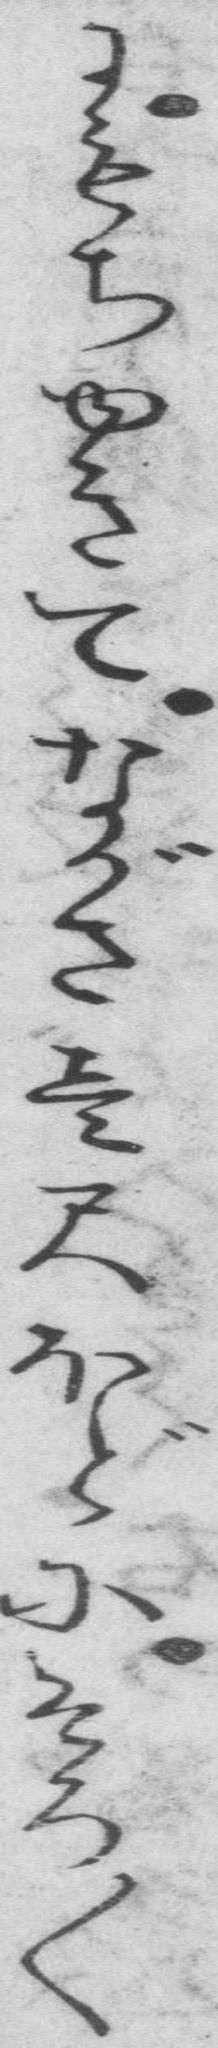に。もちゆきて。ながさ壱尺ほどに。そろ〳〵
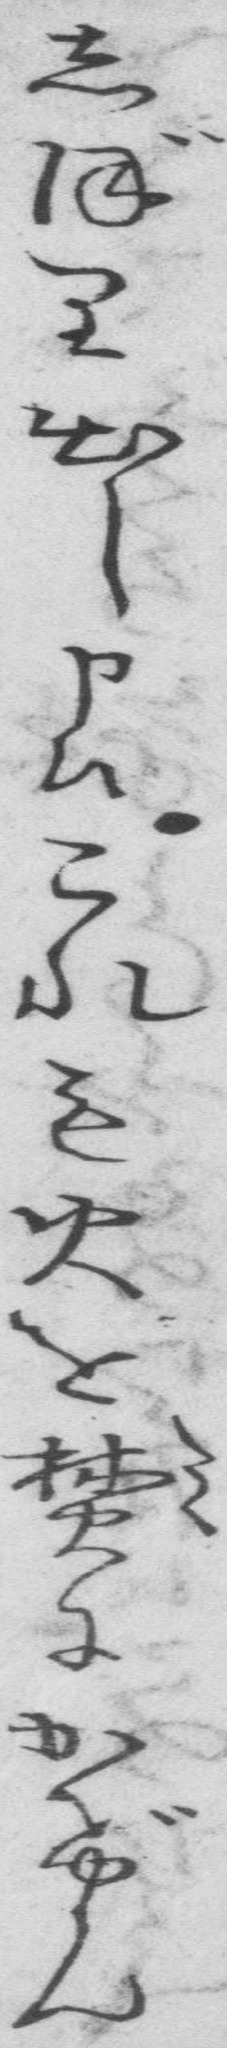しぼり出し申候。これも火を焚にかげん
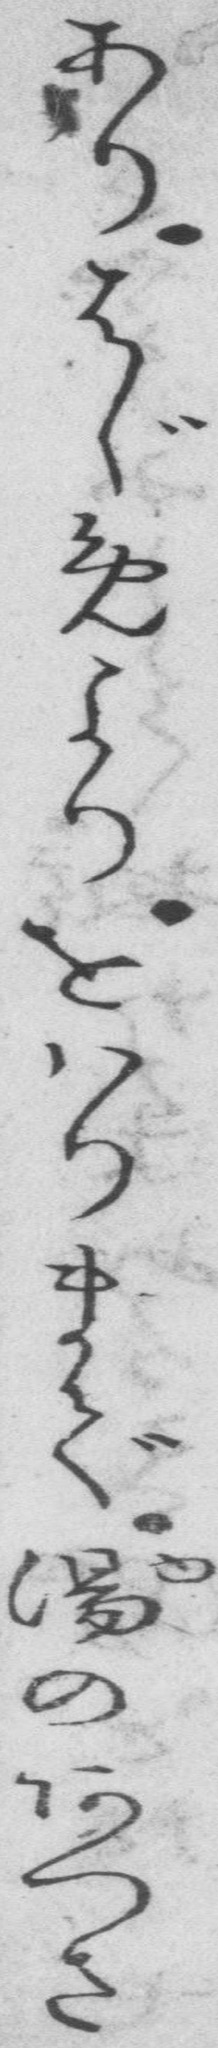あり。はじめより。をはりまで。湯のあつさ
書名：萬寳料理秘密箱
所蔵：大阪府立大学学術情報センター 国文学研究資料館
